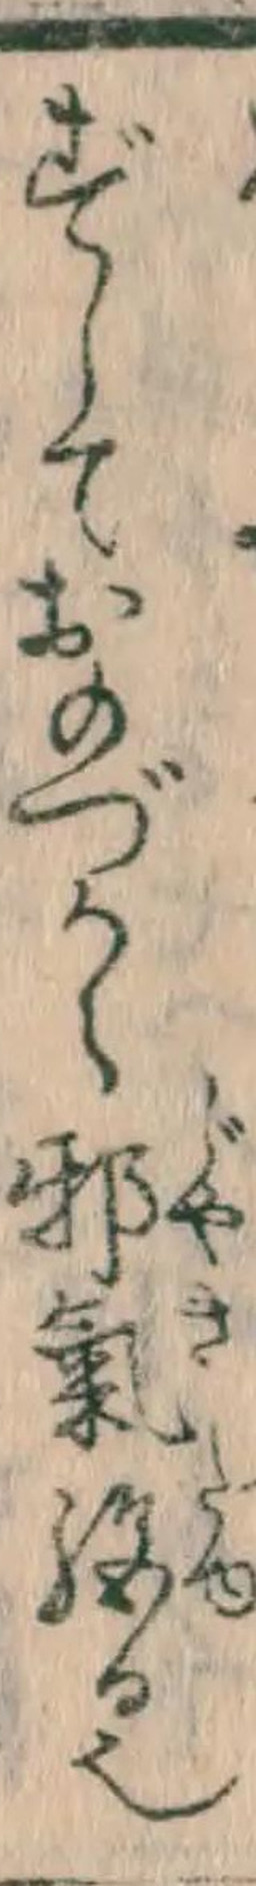ずしておのづから邪気絶る也
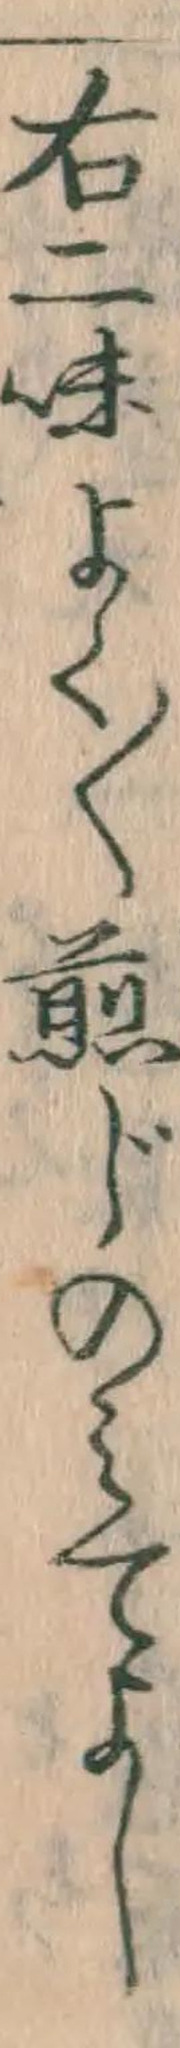右二味よく〳〵煎じのみてよし
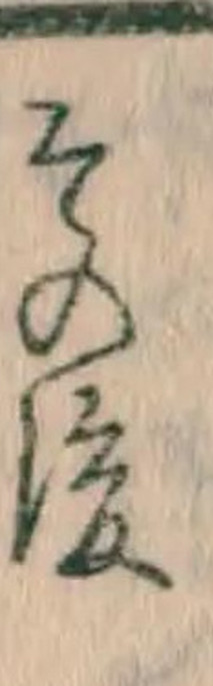その後
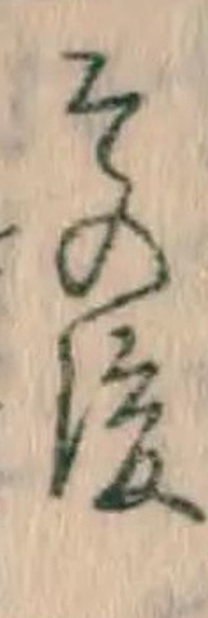その後
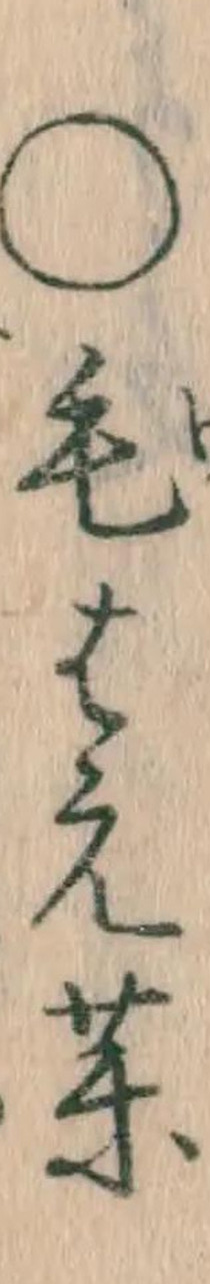○毛はえ薬
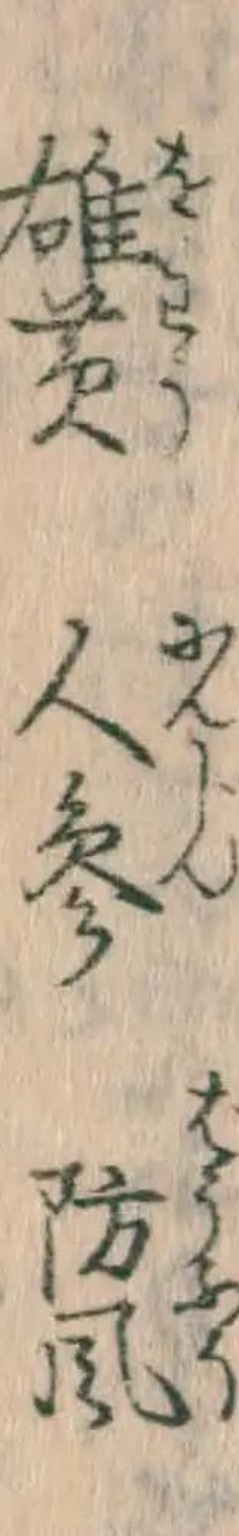雄黄人参防風
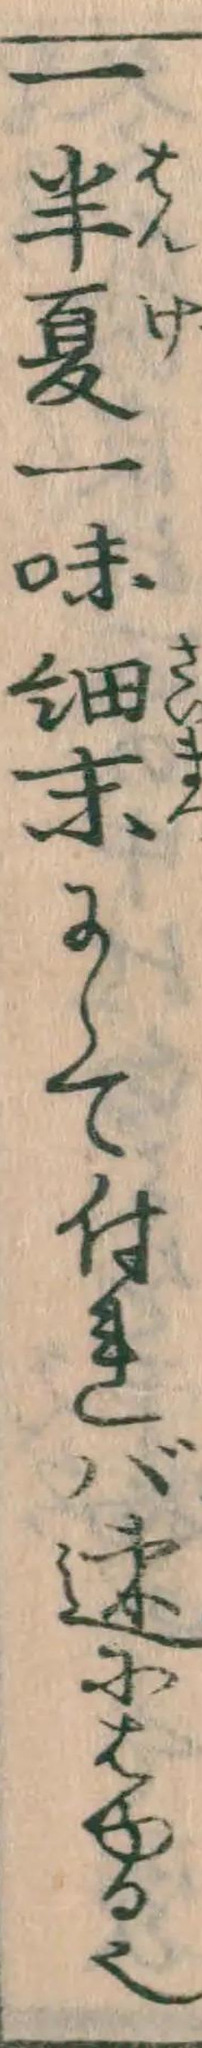一半夏一味細末にして付れば速にはゆる也
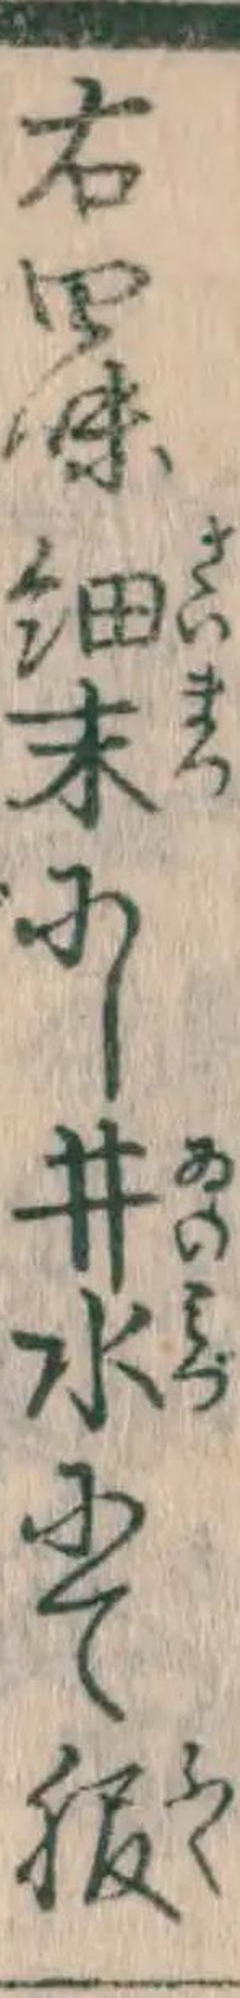右四味細末にし井水にて服
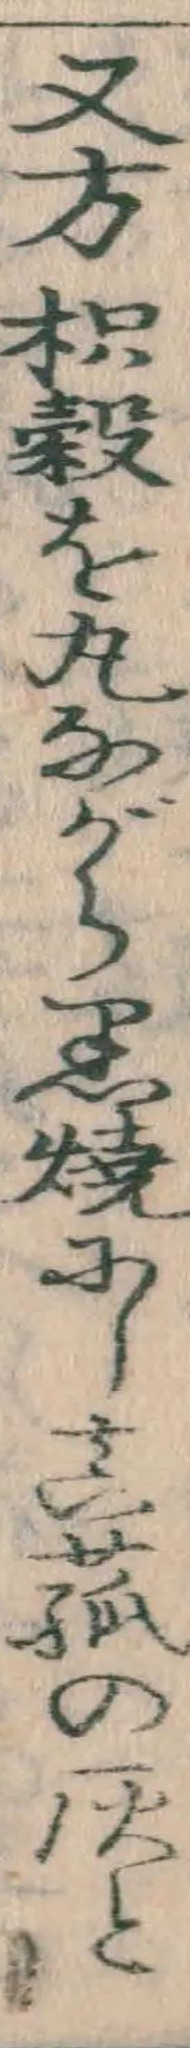又方枳穀を丸ながら黒焼にし真菰の灰と
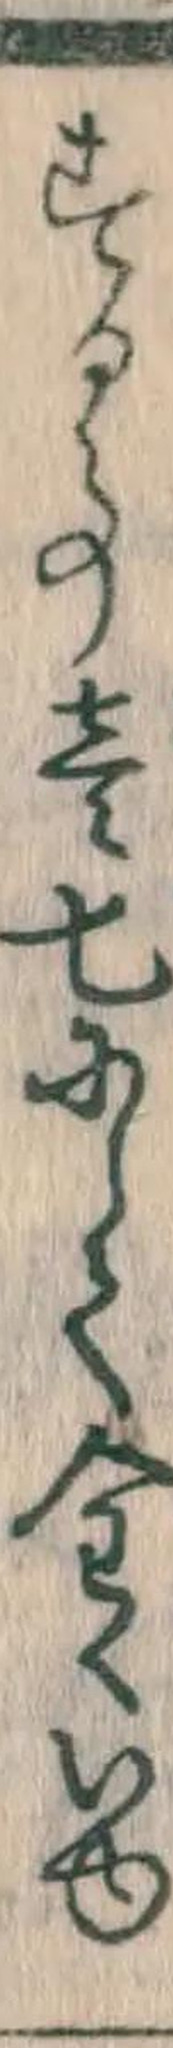する事壱匕にして全くいゆ
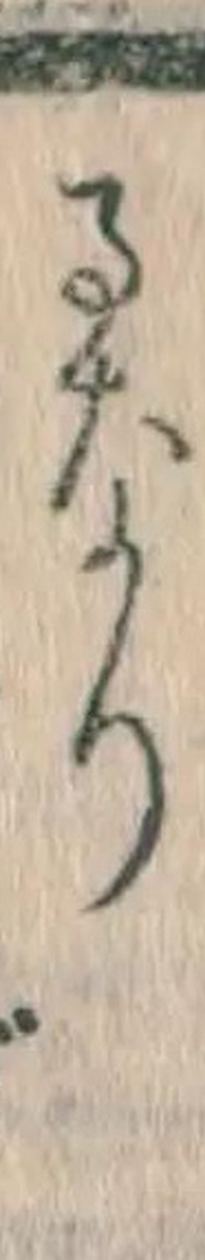るなり
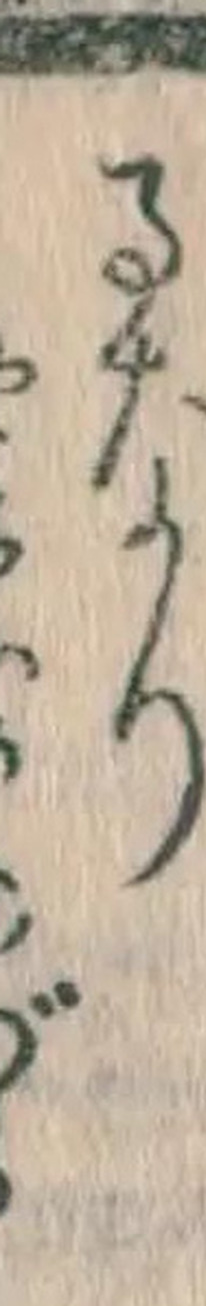るなり
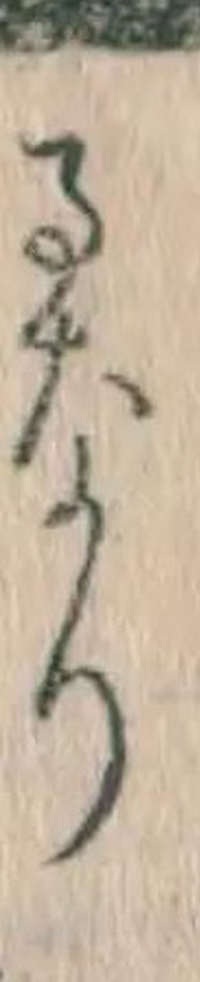るなり
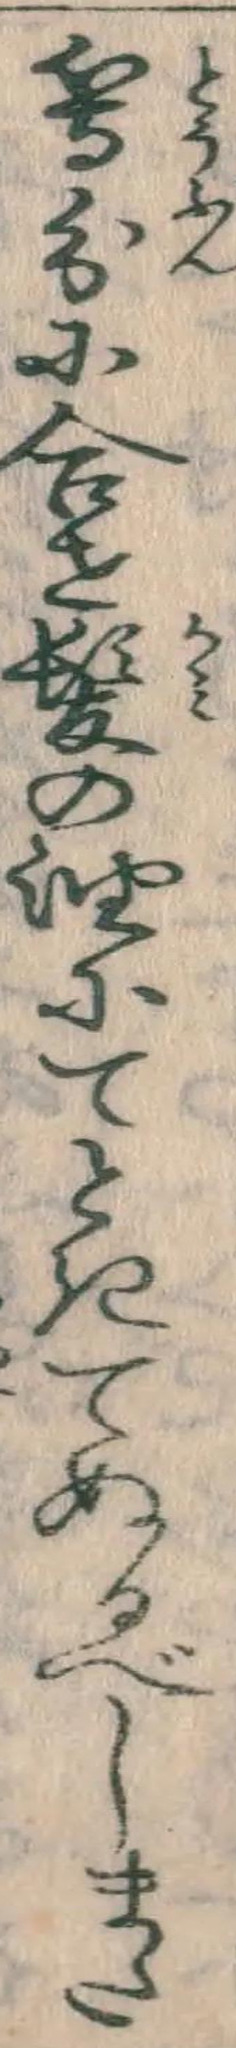等分に合せ髪の油にてときてぬるべしまた
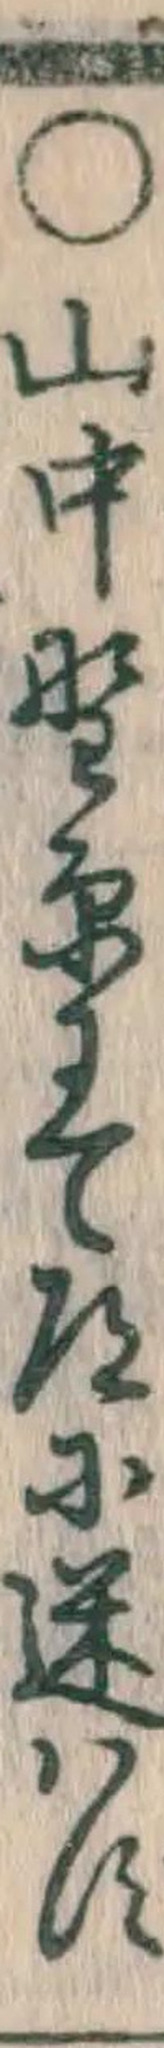○山中野原にて道に迷はず
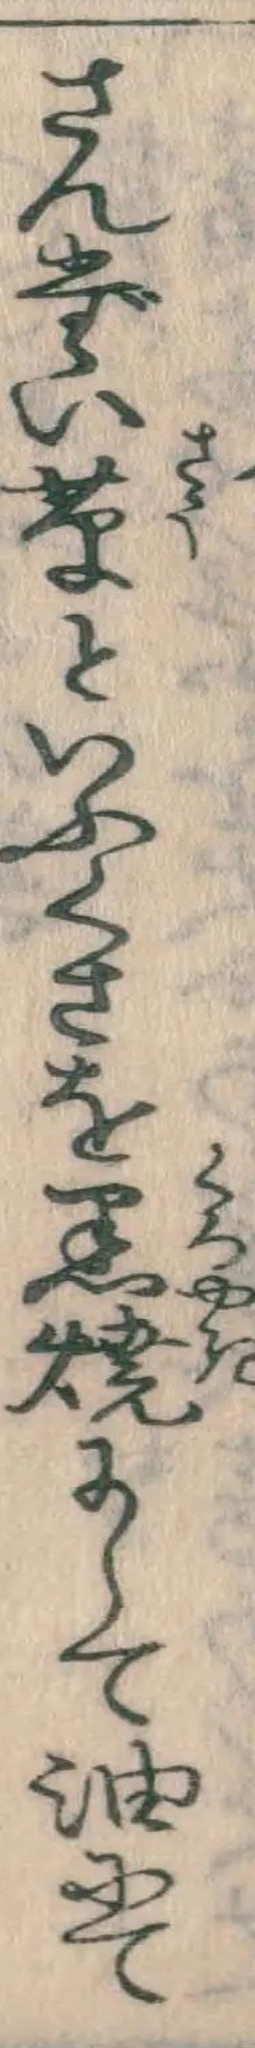さんだい草といふくさを黒焼にして油にて
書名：広益秘事大全 3巻. [4]
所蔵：国立国会図書館 National Diet Library, JAPAN
